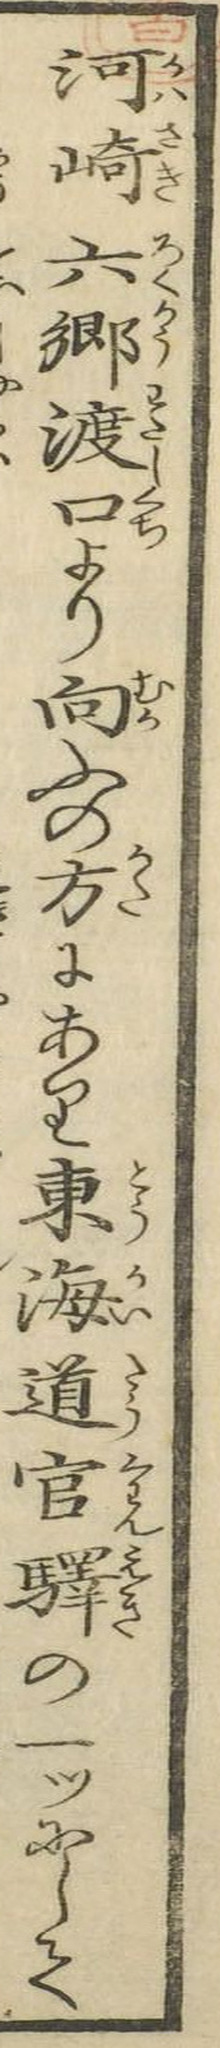河崎六郷渡口より向ふの方にあり東海道官驛の一つにして
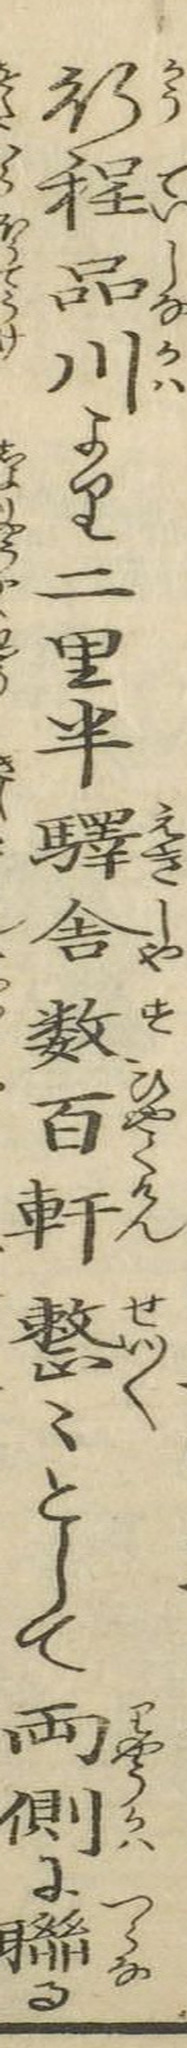行程品川より二里半驛舎数百軒整々として両側に聯る
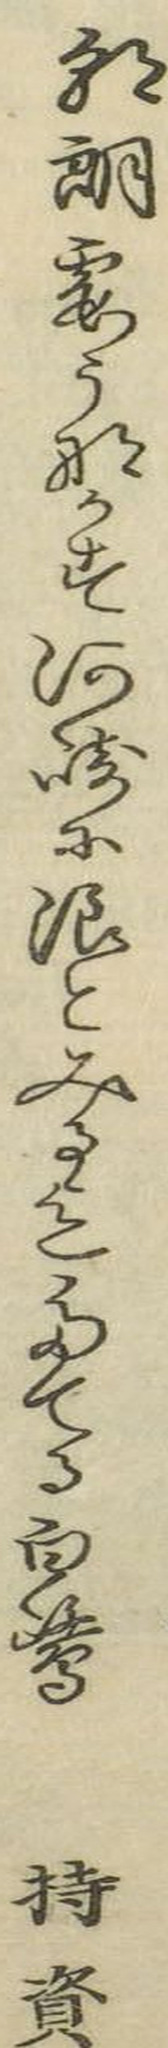朝朗霞うなかす河崎に浪とみる迄たてる白鷺持資
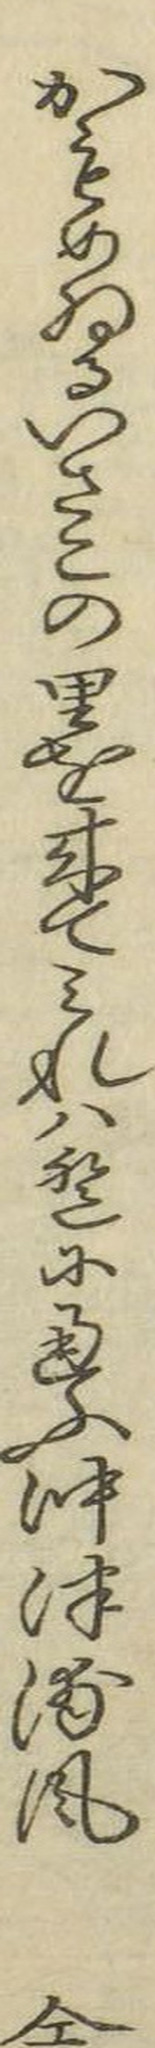かもめゐるいさこの里を来てみれは遊に通ふ沖津浦風仝
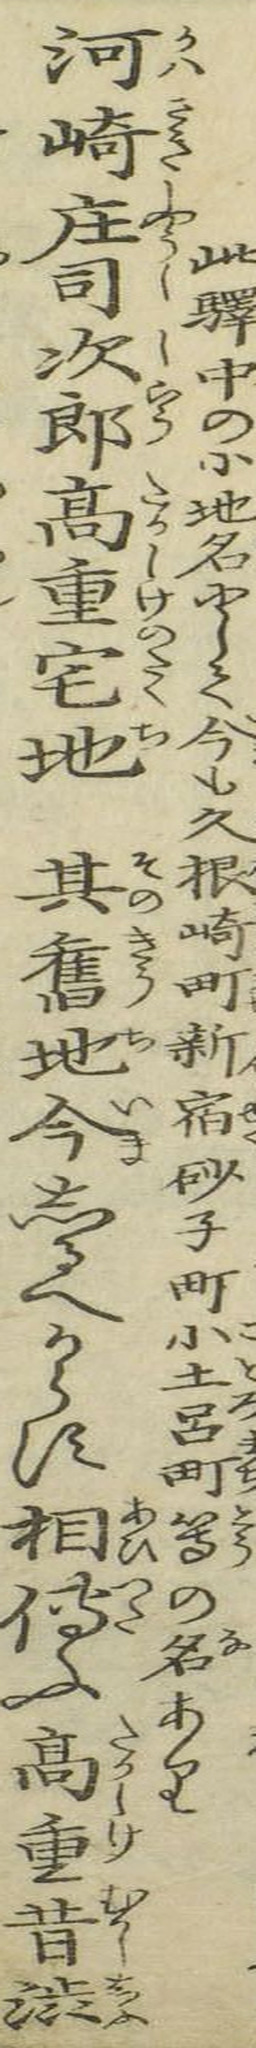河崎庄司次郎高重宅地其舊地今しるへからす相傳ふ高重昔渋
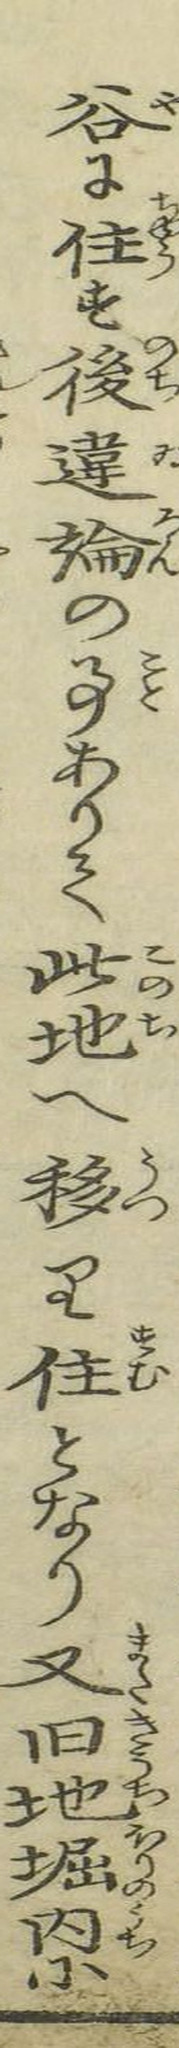谷に住す後違論の事ありて此地へ移り住となり又旧地堀内に
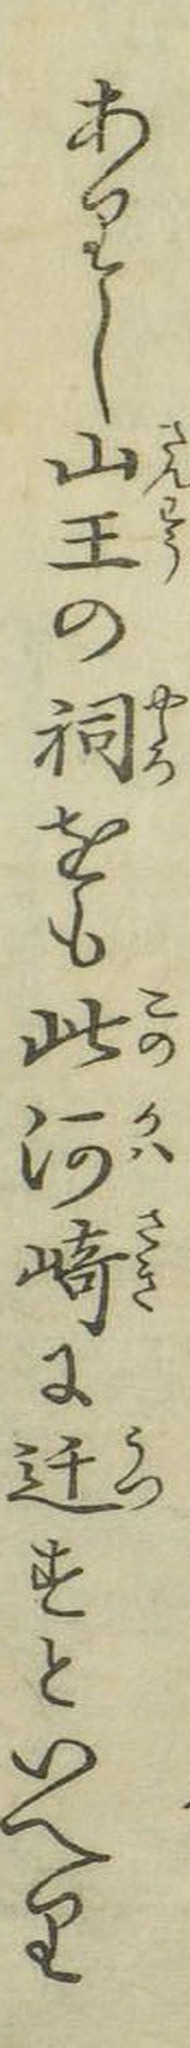ありし山王の祠をも此河崎に遷すといへり

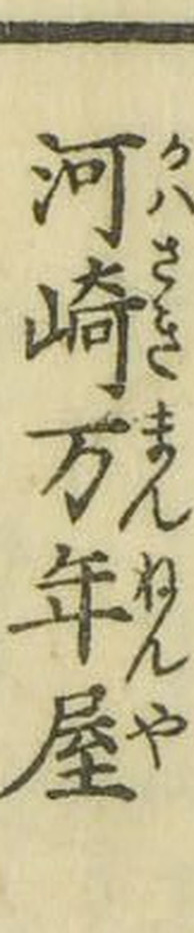河崎万年屋

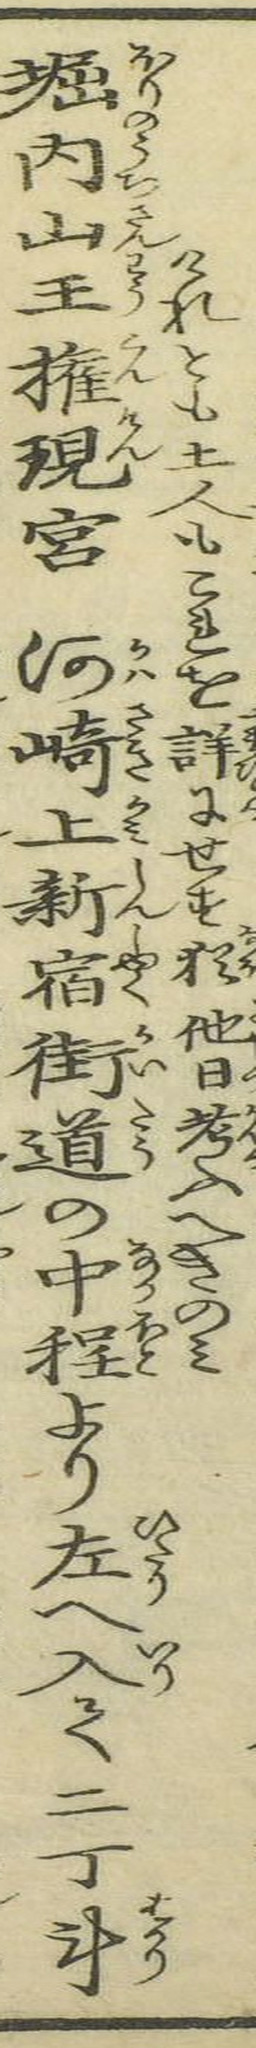堀内山王権現宮河崎上新宿街道の中程より左へ入て二丁斗
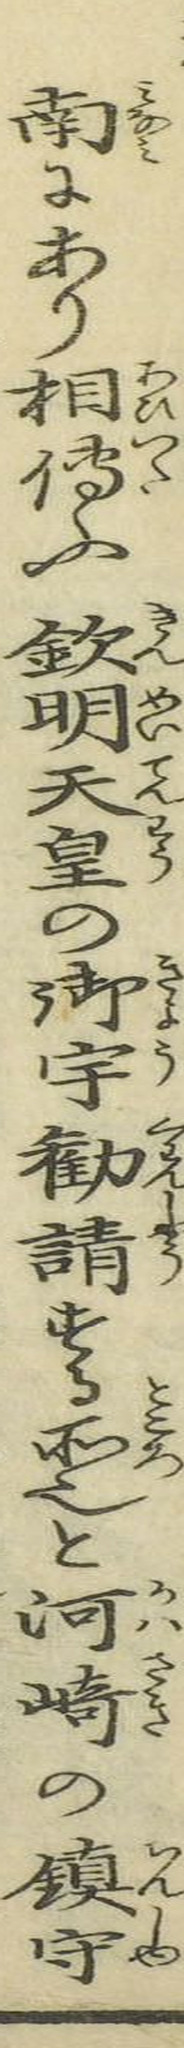南にあり相傳ふ欽明天皇の御宇勧請する所也と河崎の鎮守
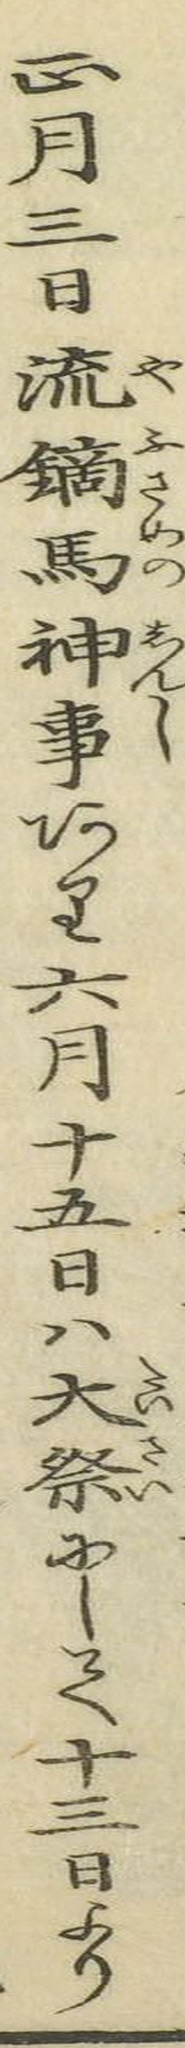正月三日流鏑馬神事あり六月十五日は大祭にして十三日より
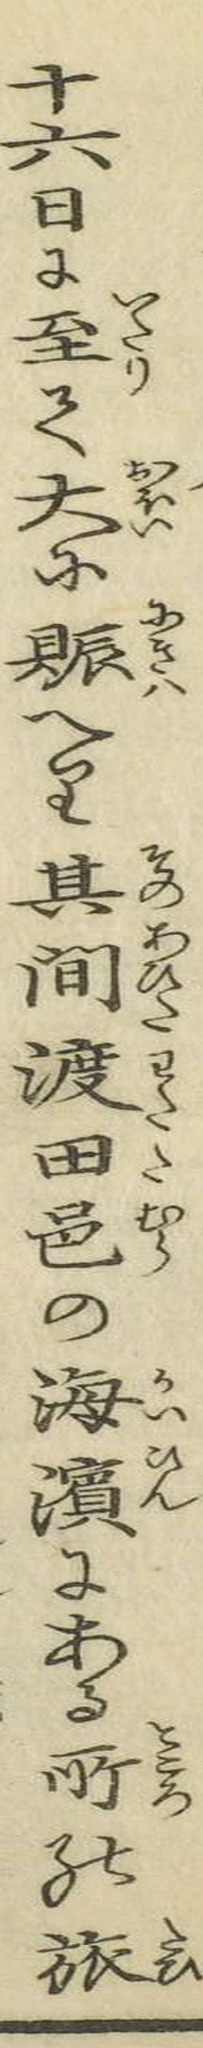十六日に至て大に賑へり其間渡田邑の海濵にある所の旅
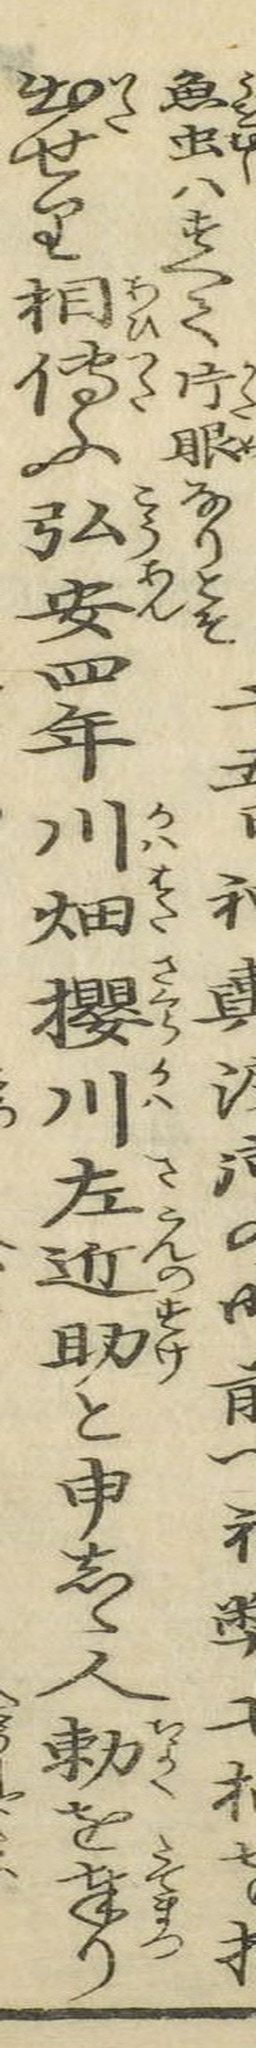出せり相傳ふ弘安四年川畑櫻川左近助と申しゝ人勅を奉り
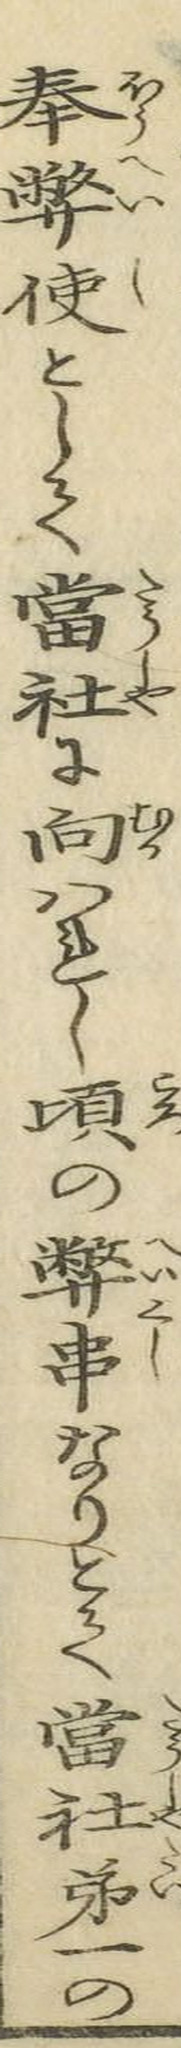奉弊使として當社に向はれし頃の弊串なりとて當社第一の
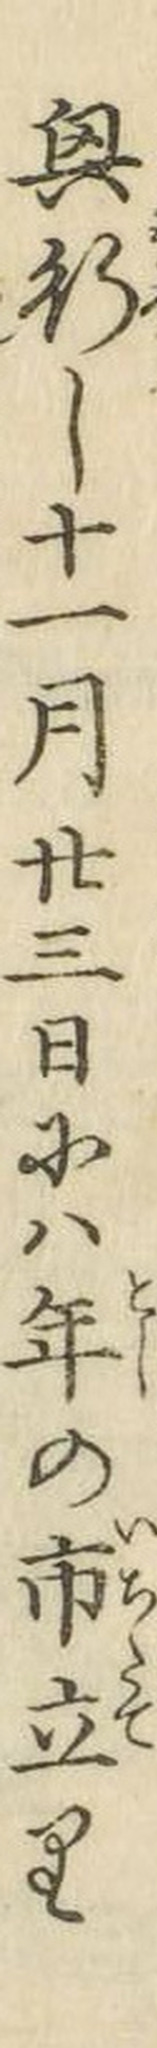興行し十一月廿三日には年の市立り
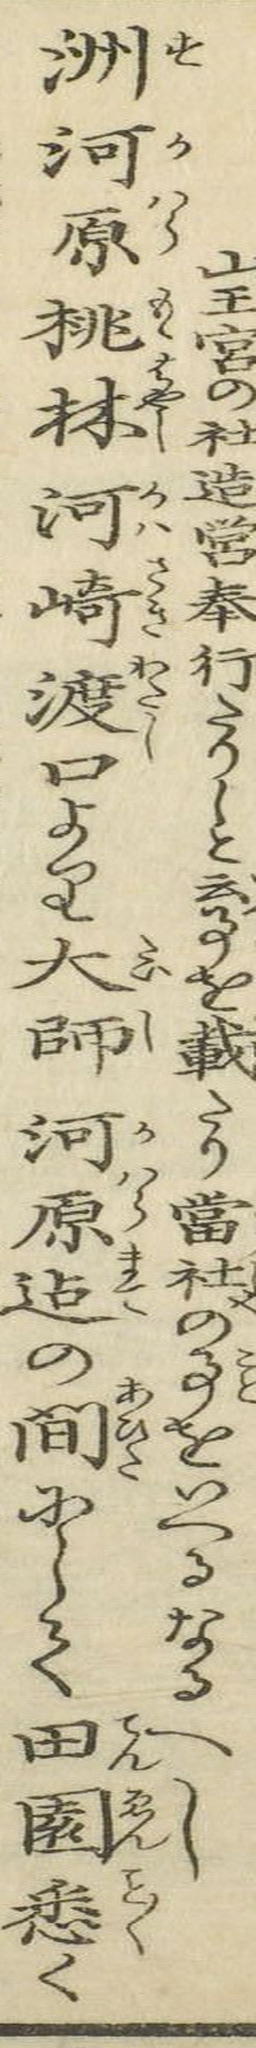洲河原桃林河崎渡口より大師河原迄の間にして田園悉く
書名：江戸名所図会 20巻 巻之5
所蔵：東京学芸大学教育コンテンツアーカイブ
